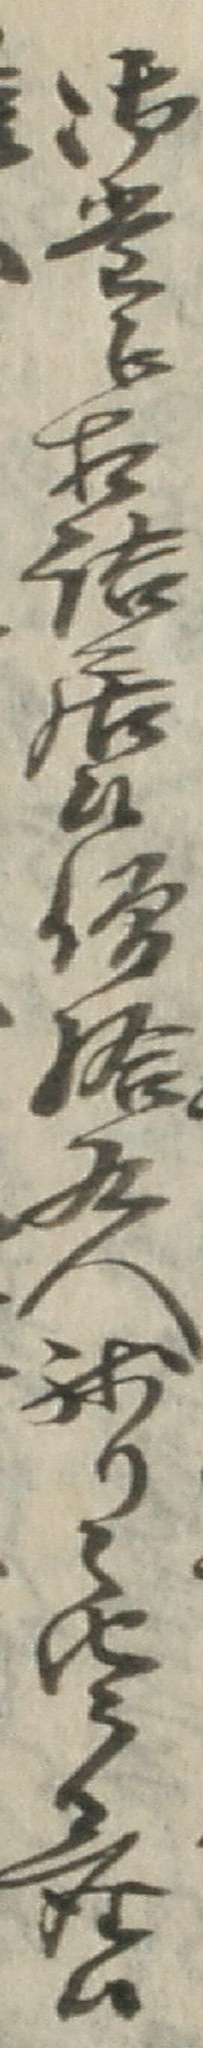御堂江相詰居候僧拾九人残り候由二御座候
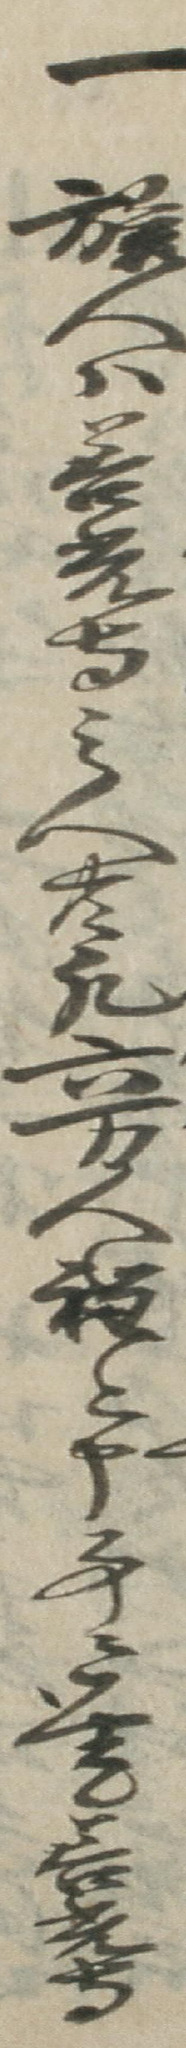一旅人ハ善光寺之人共凡六万人程と申事二御座候善光寺
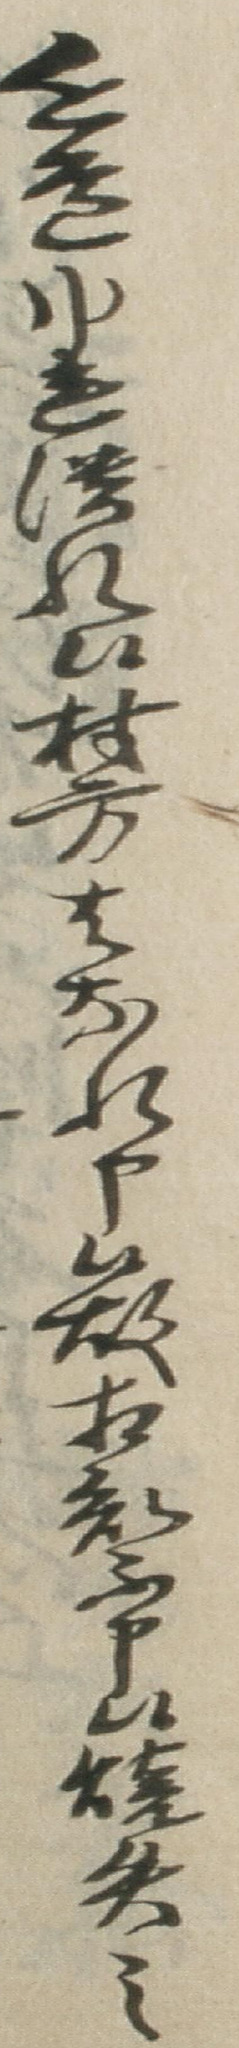近辺ゆれ潰れ候村方はなれ申候故相知不申候焼失之
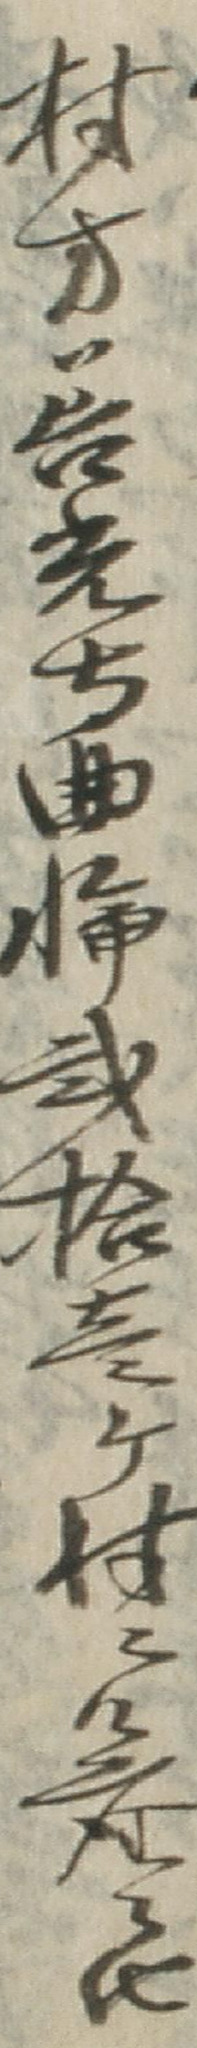村方善光寺曲輪弐拾壱ヶ村二御座候由
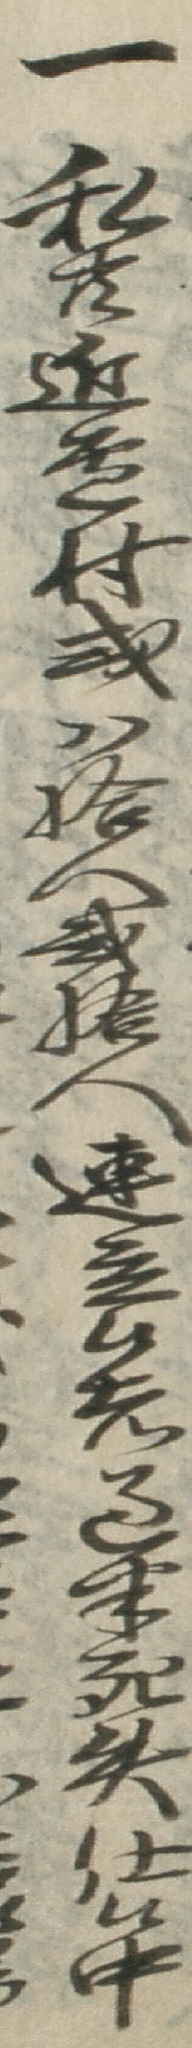一私共近辺村或ハ拾人弐拾人連立候者過半死失仕候中
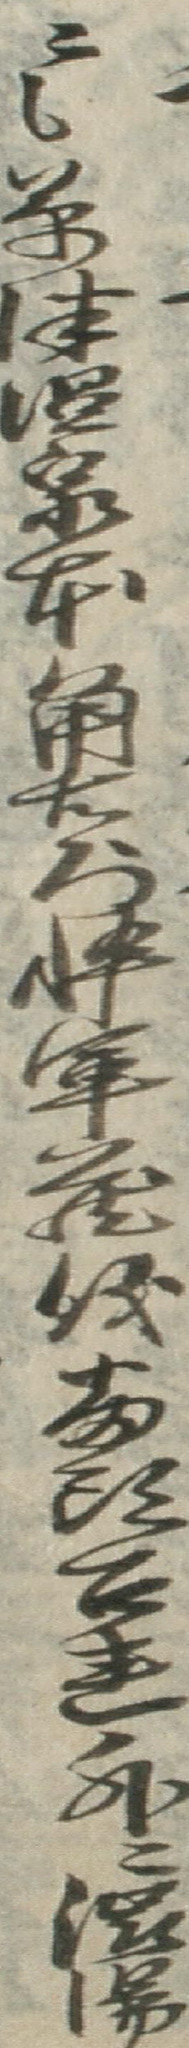二も草津温泉本角右衛門忰軍蔵儀両頭召連外二渋湯
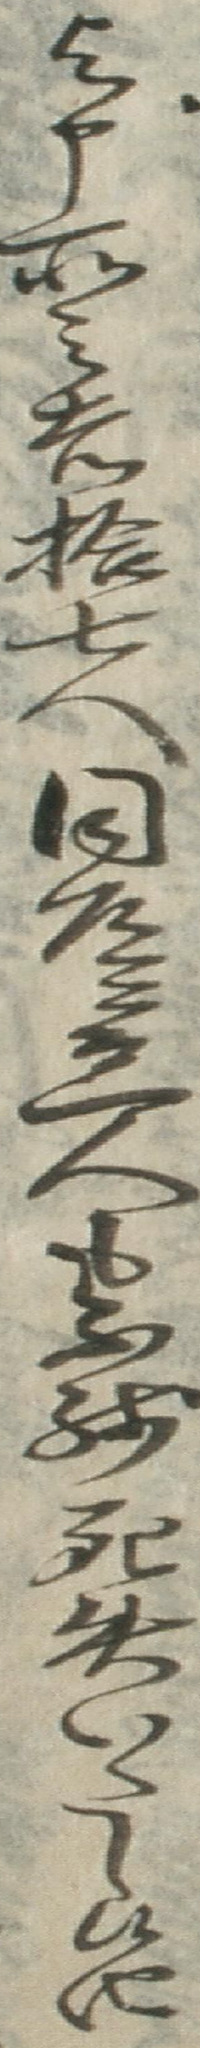と申所之者拾七人同道二而一人も不残死失いたし候由
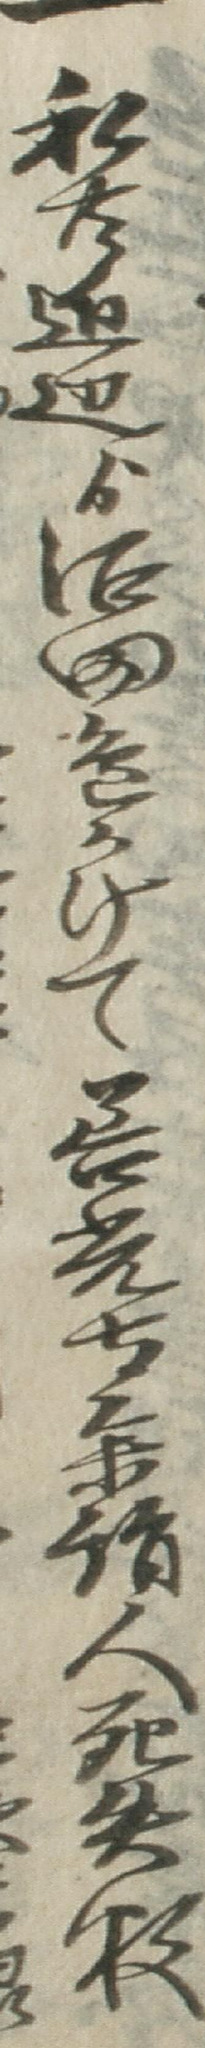一私共近辺ゟ沼田辺かけて善光寺参詣人死失数
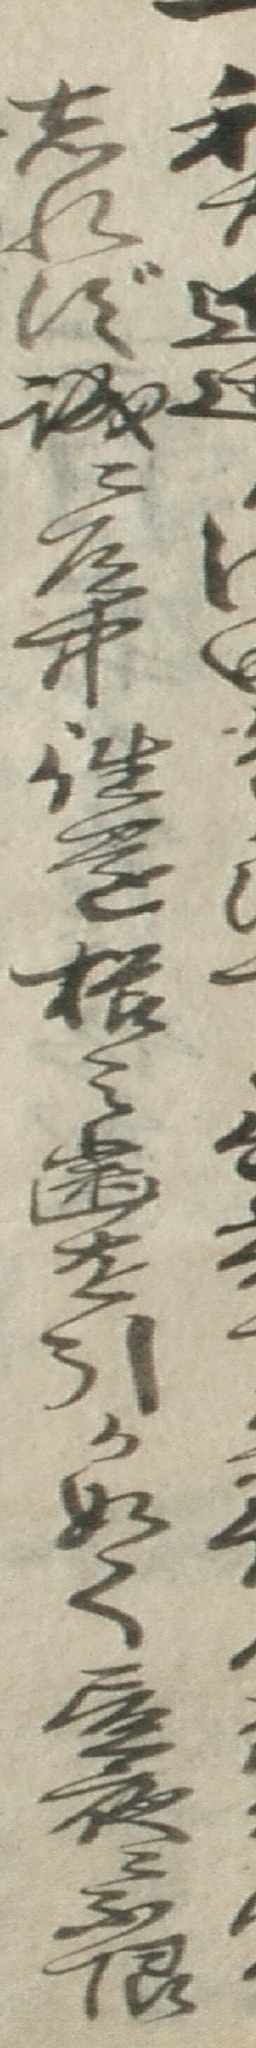しれず誠二道中往還櫛之歯を引ク如く昼夜二不限
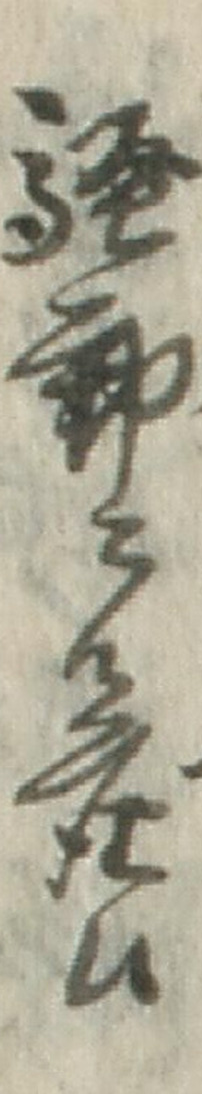騒動二御座候
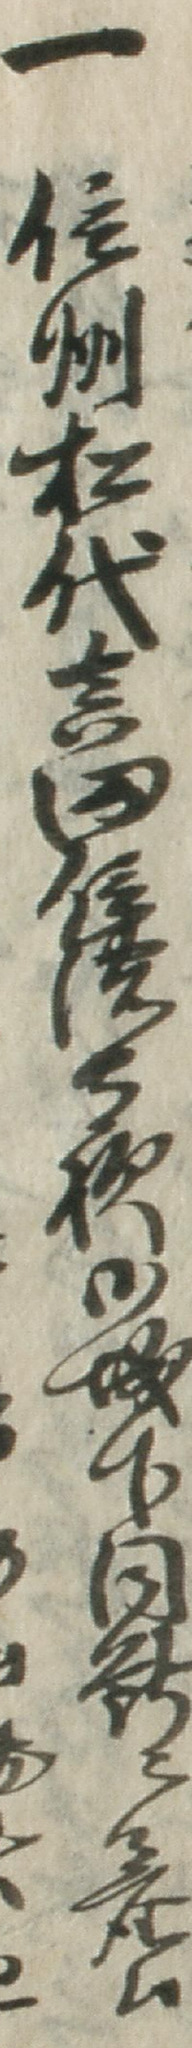一信州松代真田信濃守様御城下同断二御座候
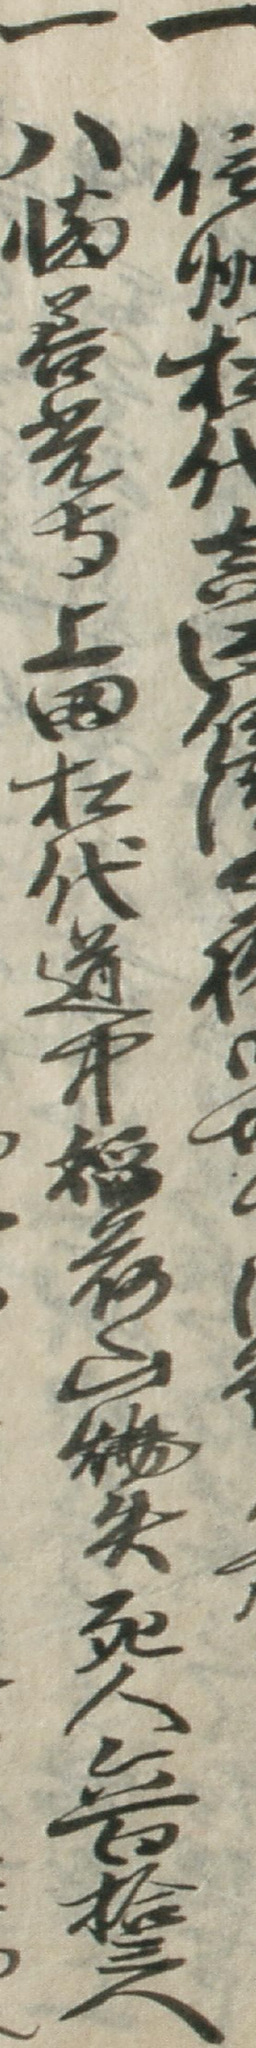一八幡善光寺上田松代道中稲荷山焼失六百拾三人
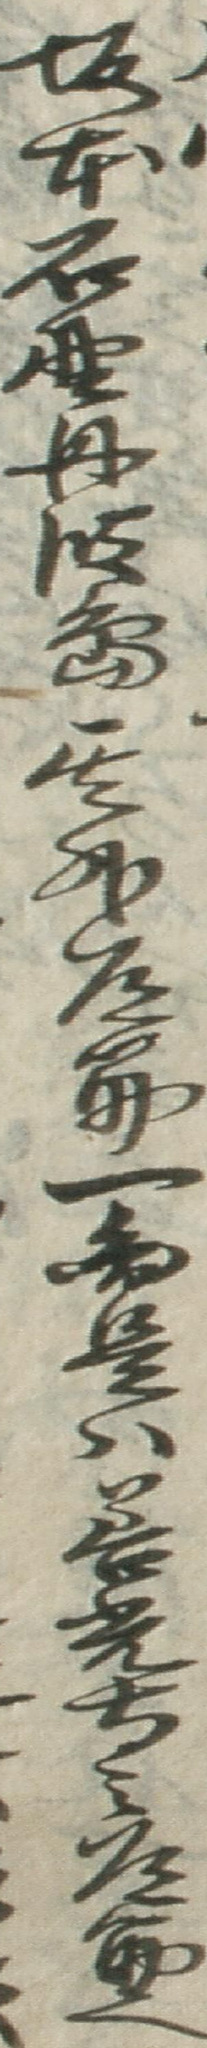坂本石野丹波島其外道筋一圓是ハ善光寺之道筋也
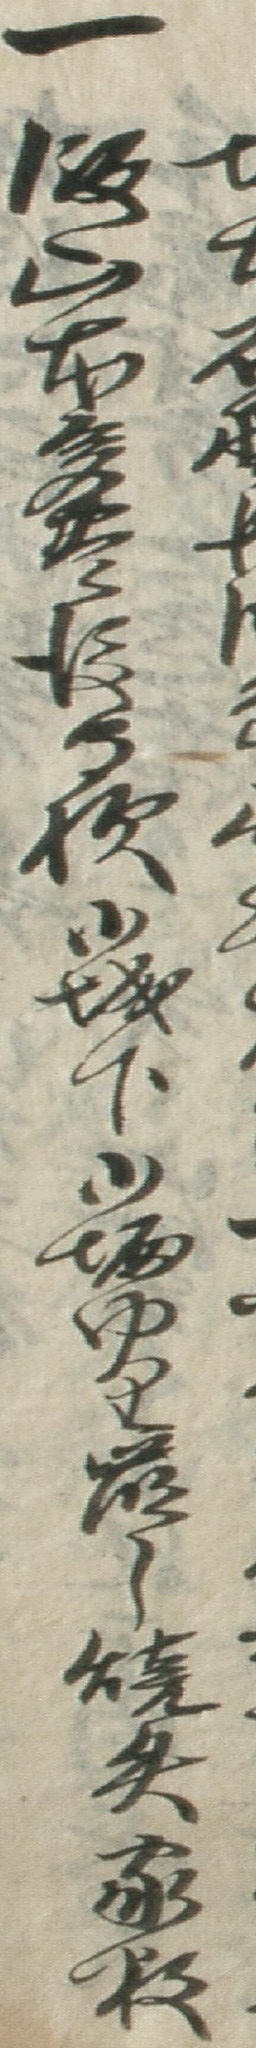一飯山本多豊後守様御城下御城ゆり崩し焼失家数
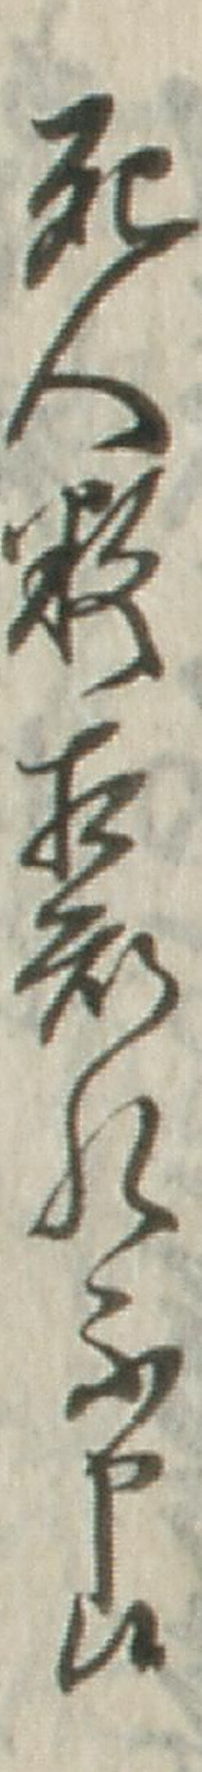死人数相知れ不申候
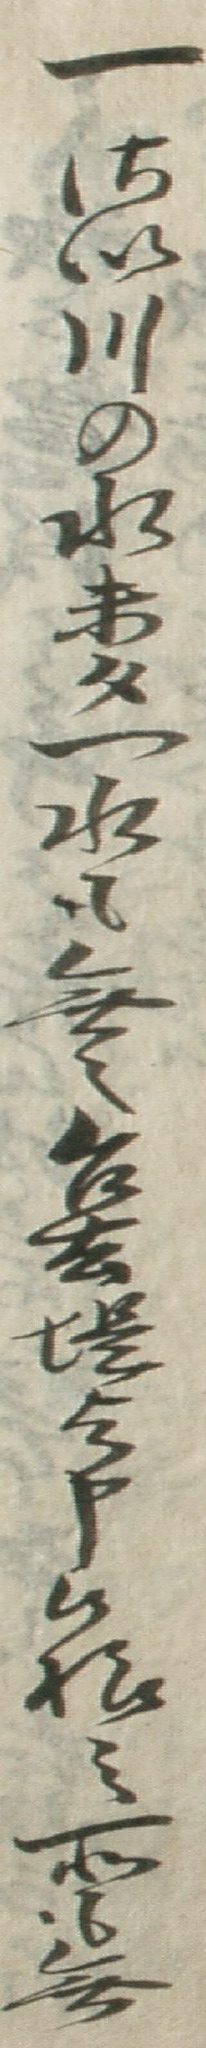一さい川の水未タ一水も無之乍去堤と申候様之所も無
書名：信濃國地震實録記
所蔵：東京大学地震研究所図書室 Earthquake Research Institute Library, The University of Tokyo, JAPAN
